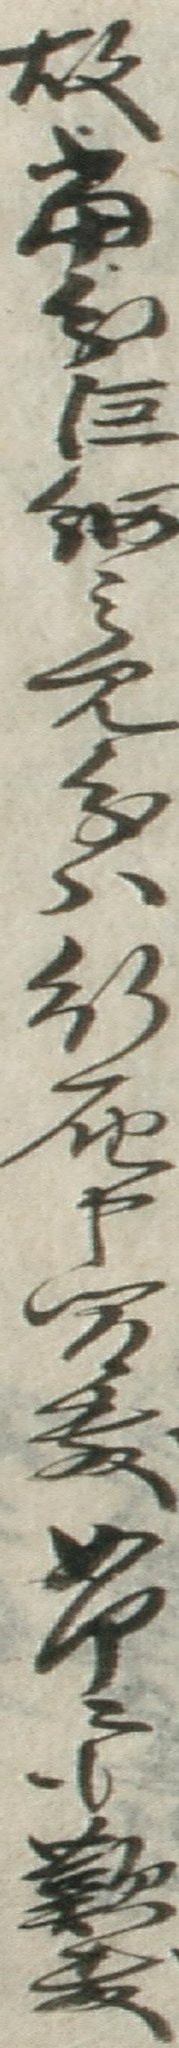故当分巨細之見分ハ行届申間敷如何二も歎敷
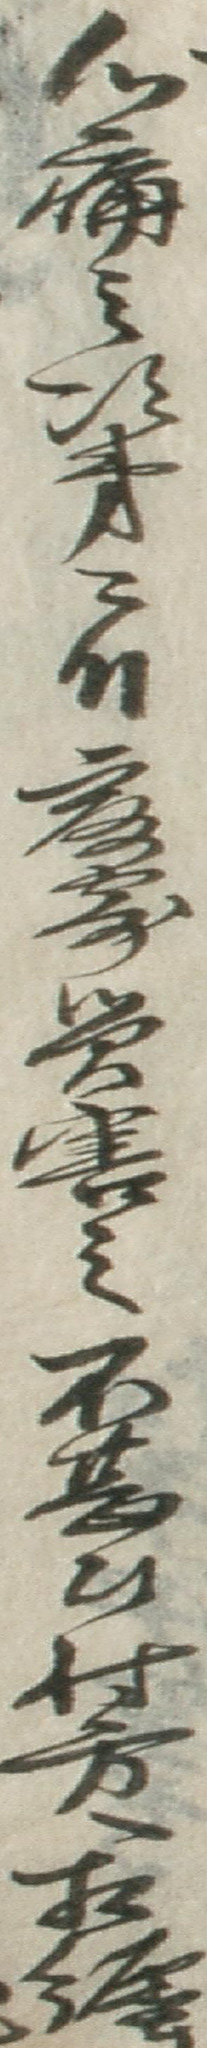心痛之次第二付最寄災害之不甚候村方ㇸ相纏
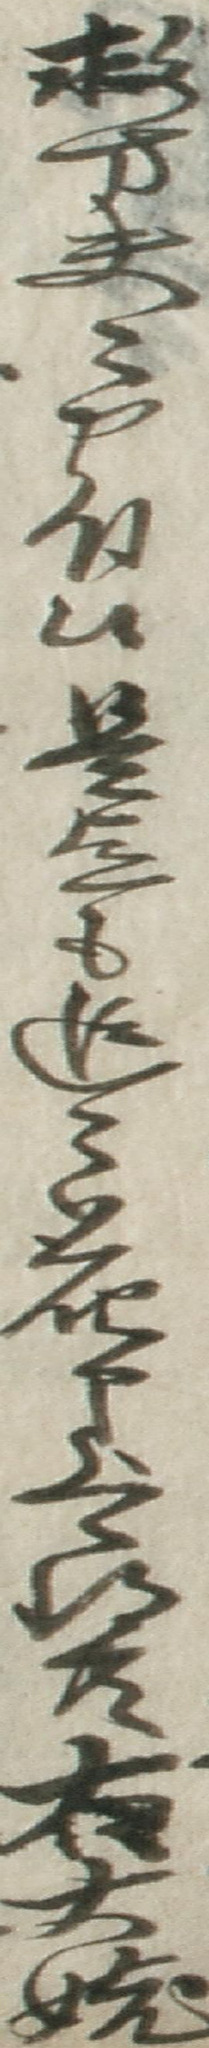救方夫々申付候是迄も追々御届申上候得共右大姥
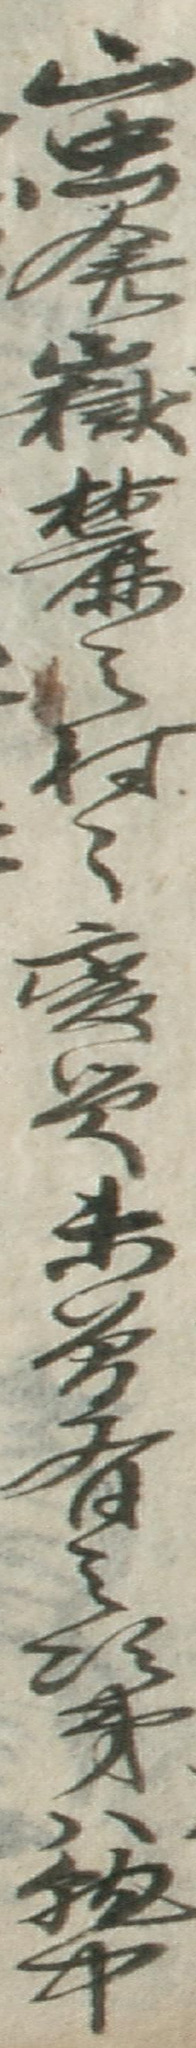山虫倉嶽麓之村々変災未曾有之次第ハ就中
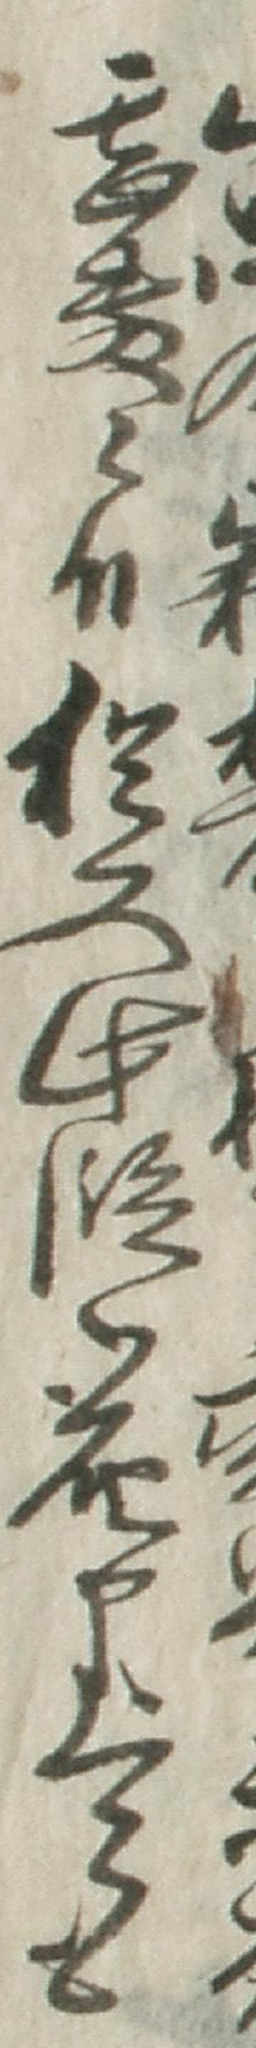甚敷候付猶又此段御届申上候以上

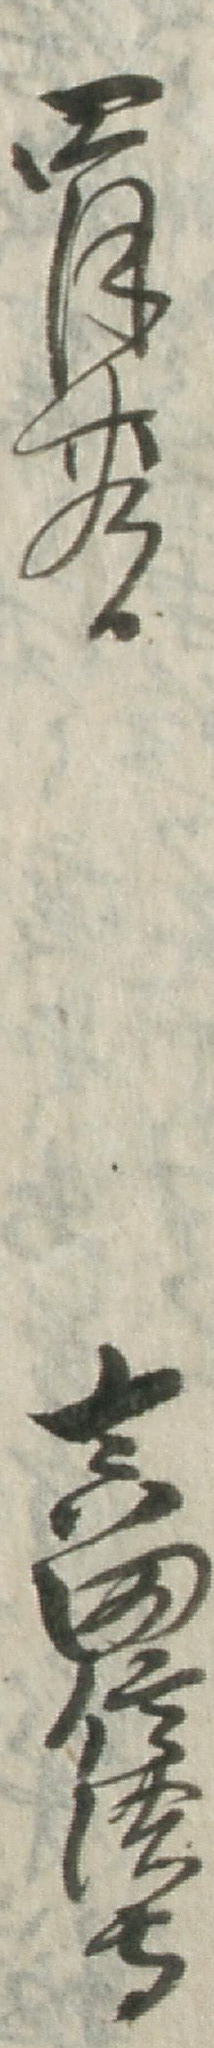四月廿九日真田信濃守
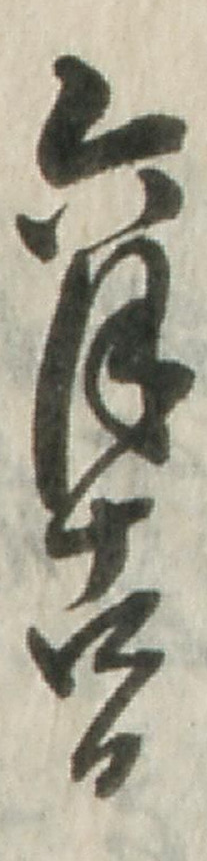六月十四日
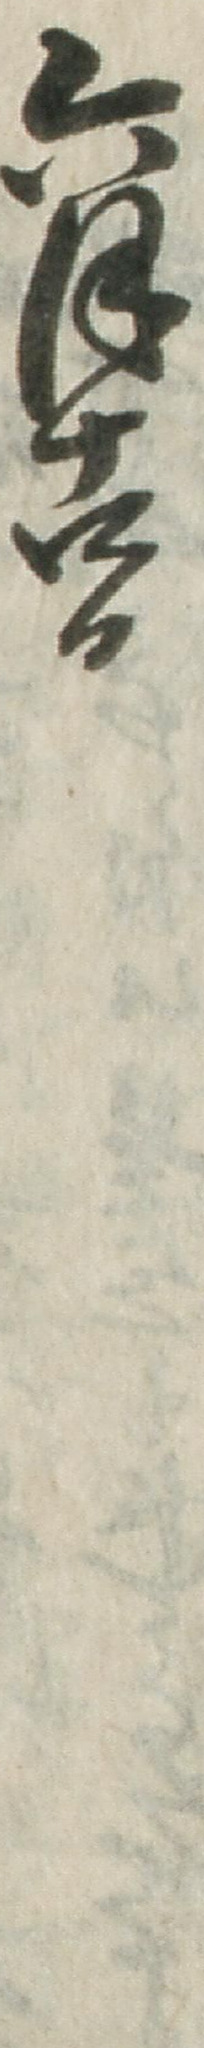六月十四日
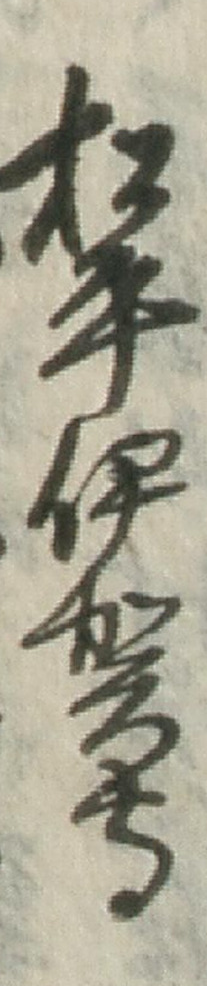松平伊賀守
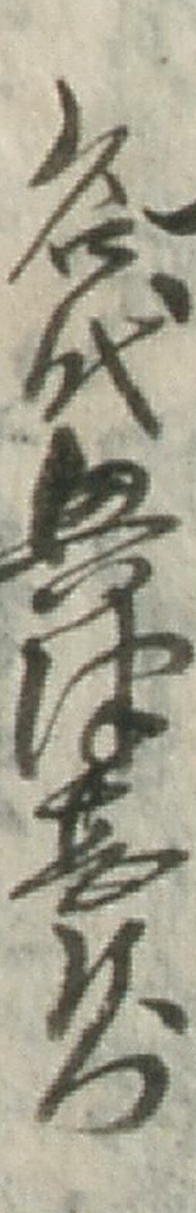名代興津甚左衛門
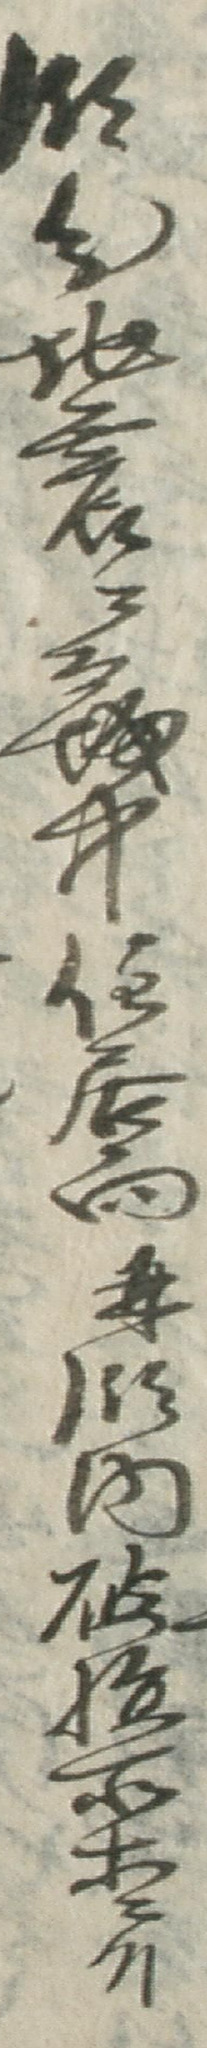領分地震二而居城中住居向并領内破損所等二付
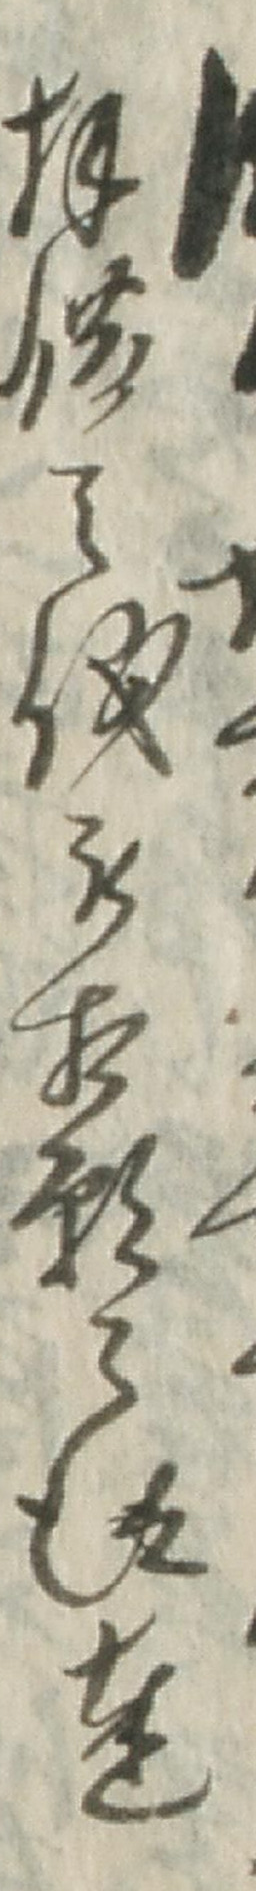拝借之儀被相願候趣達
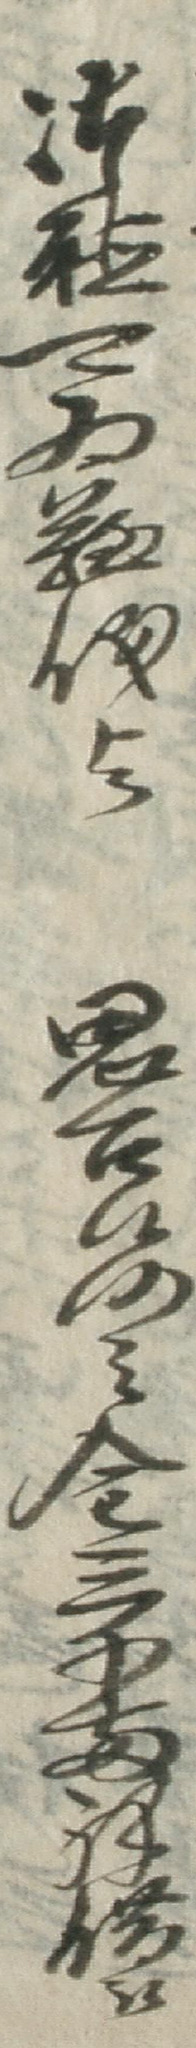御聴可為難儀と思召候仍之金三千両拝借被
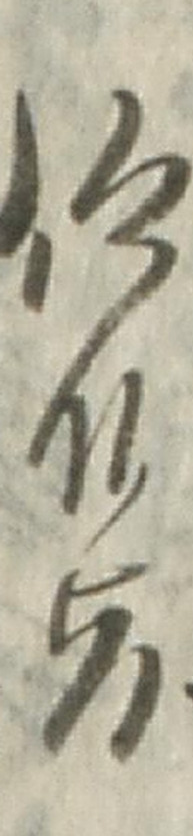仰付旨
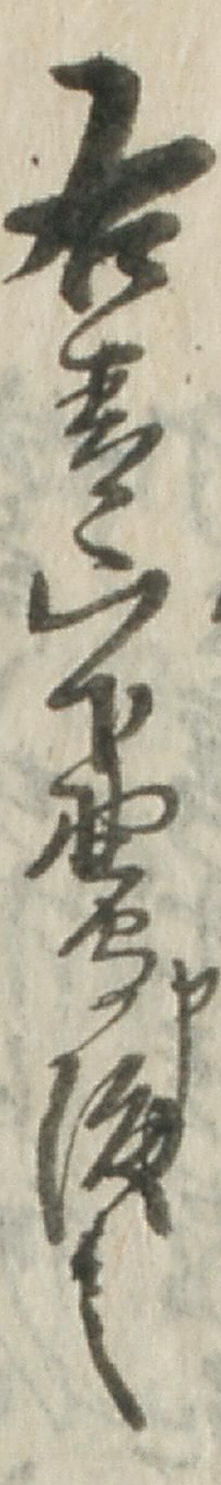右青山下野守申渡之
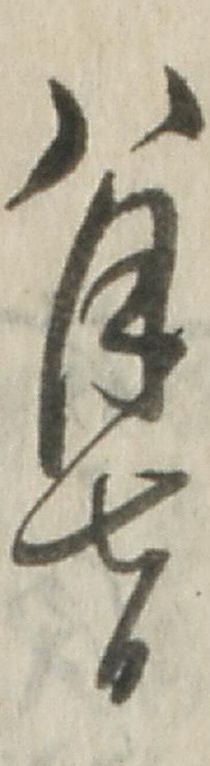八月七日
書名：信濃國地震實録記
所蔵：東京大学地震研究所図書室 Earthquake Research Institute Library, The University of Tokyo, JAPAN
